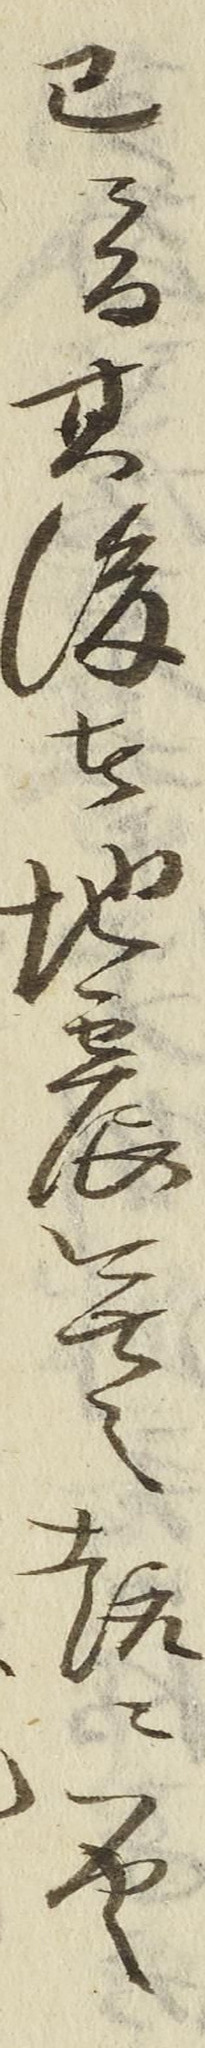巳二而其後は地震無之趣二御座候
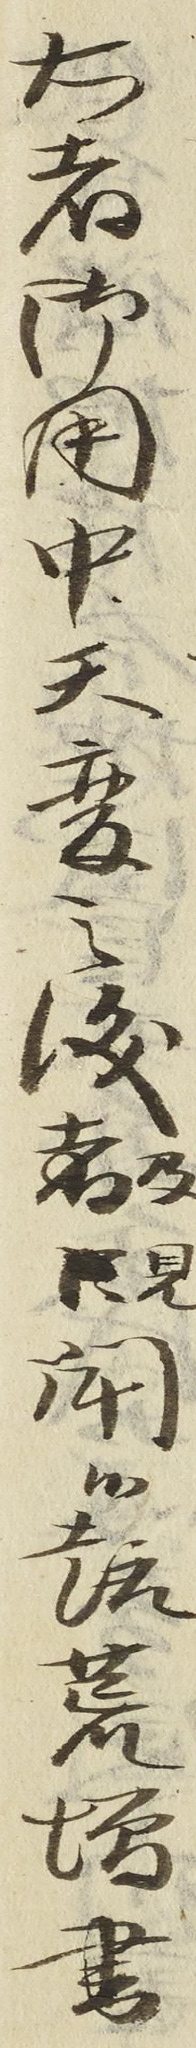右は御用中天変之儀及見聞候趣荒増書
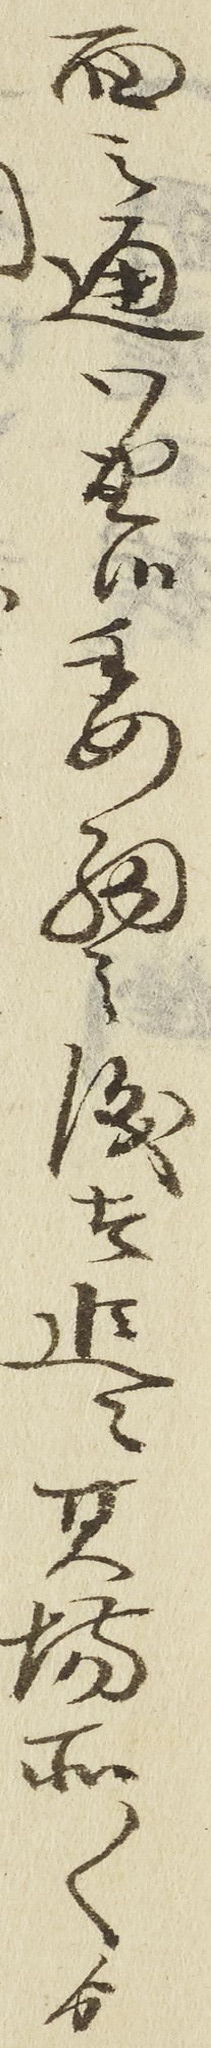面之通御座候委細之儀は追々其場所〳〵ゟ
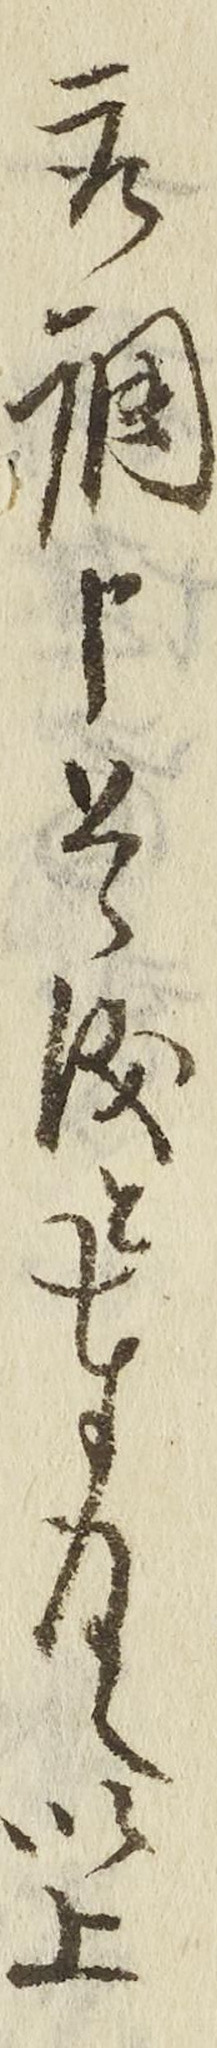取調申上候儀と奉存候以上
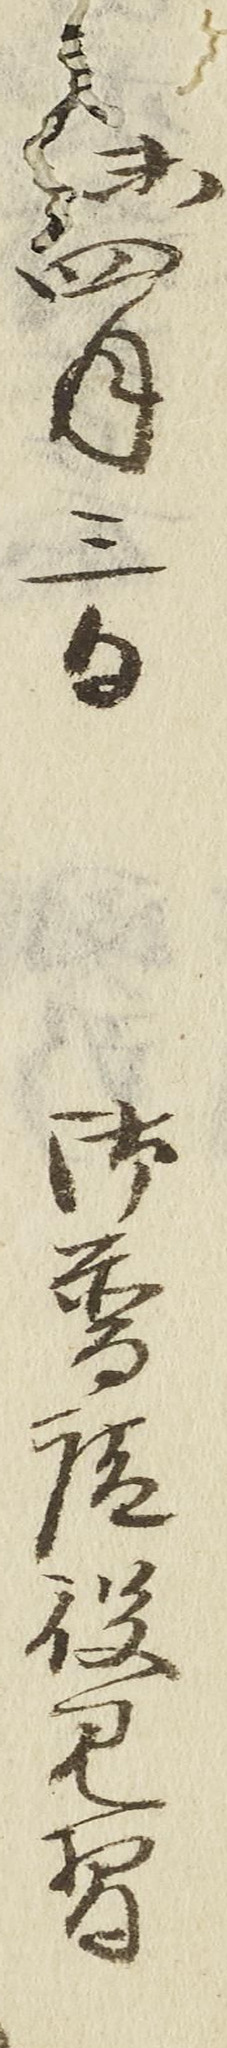御普請役見習
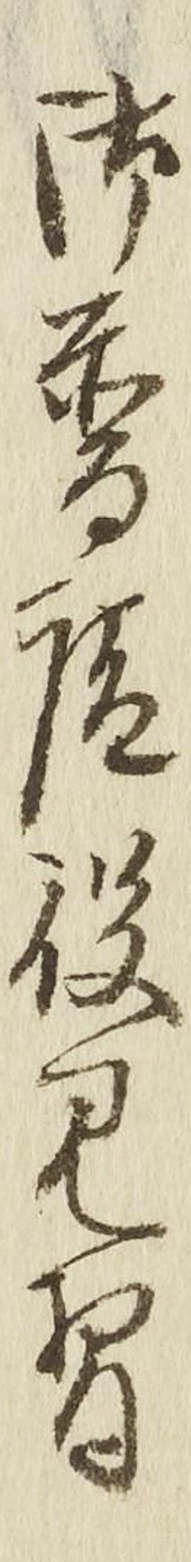御普請役見習
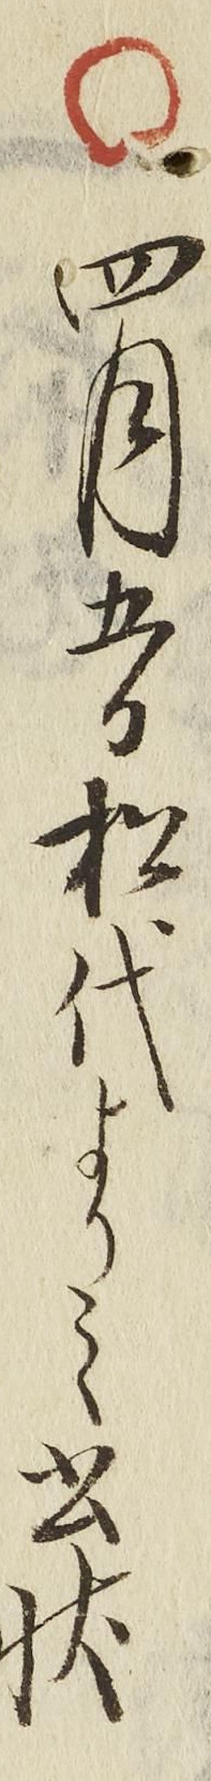○四月五日松代より之書状
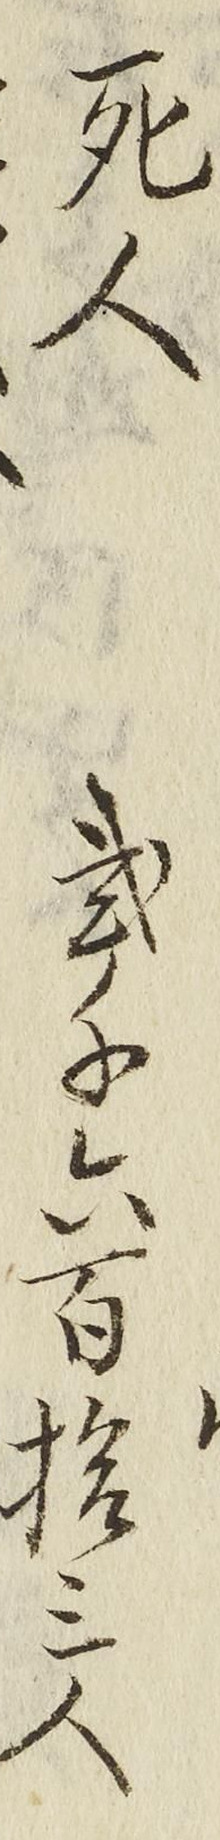死人弐千六百拾三人
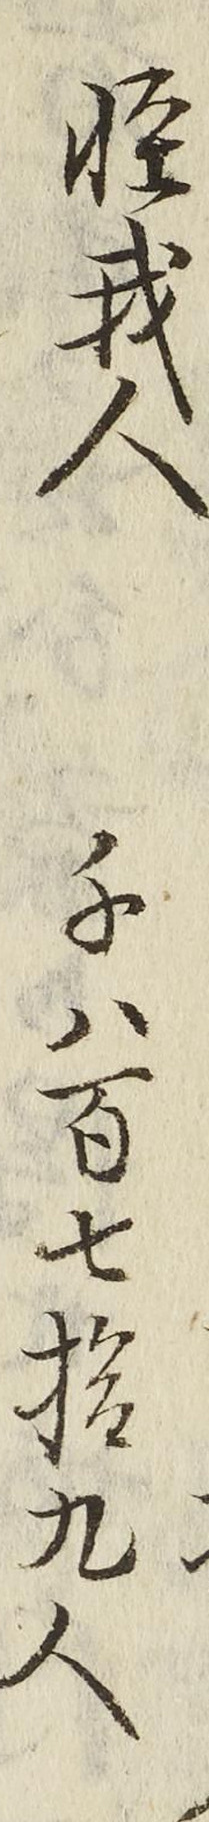怪我人千八百七拾九人
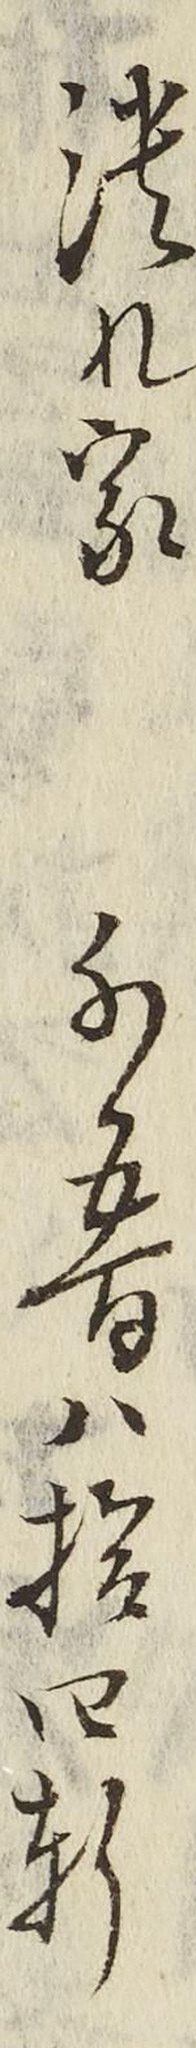潰れ家千七百五拾壱軒
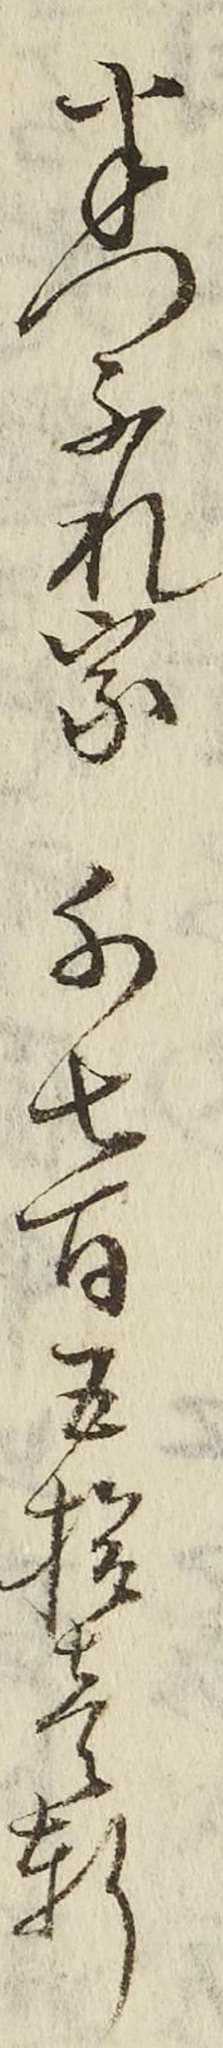潰れ家千七百五拾壱軒
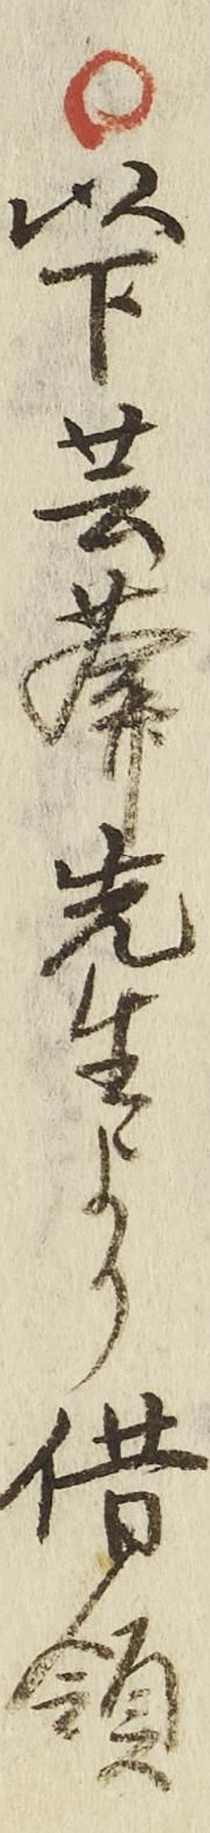○以下芸庵先生より借領

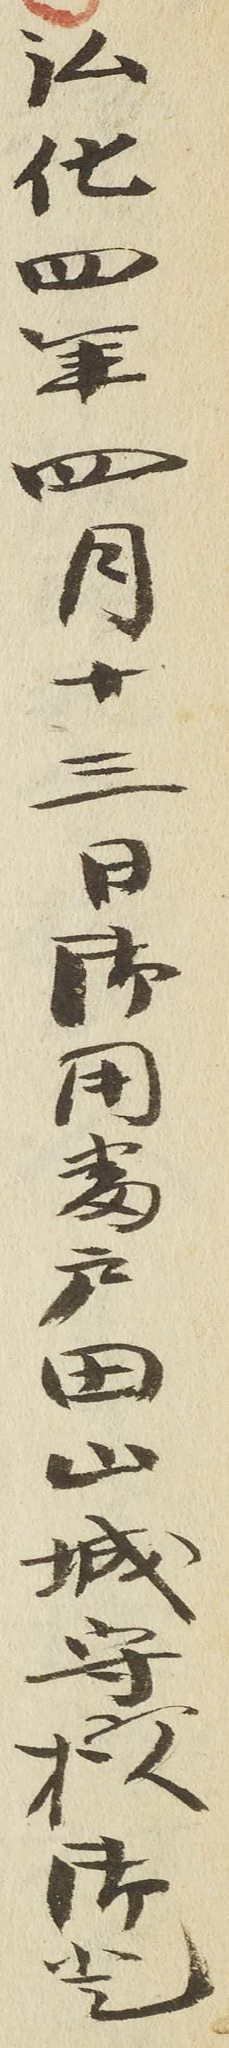○弘化四年四月十三日御用番戸田山城守様御登
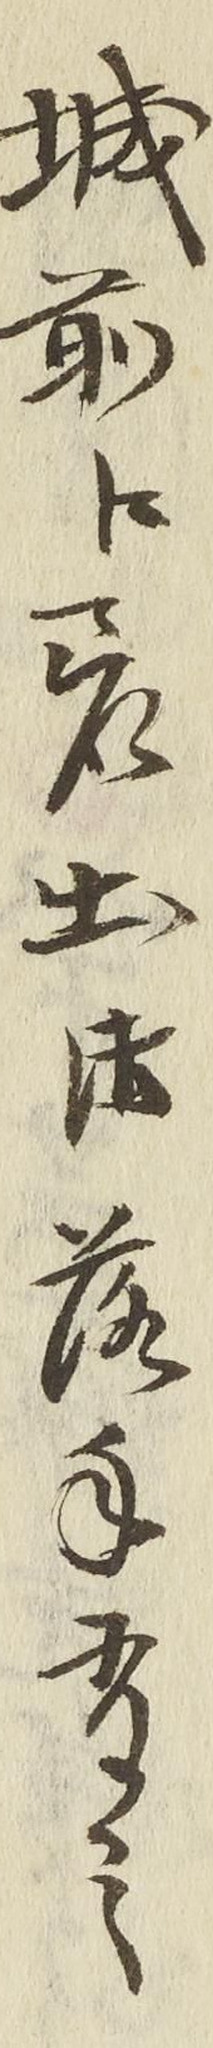城前得差出御落手有之
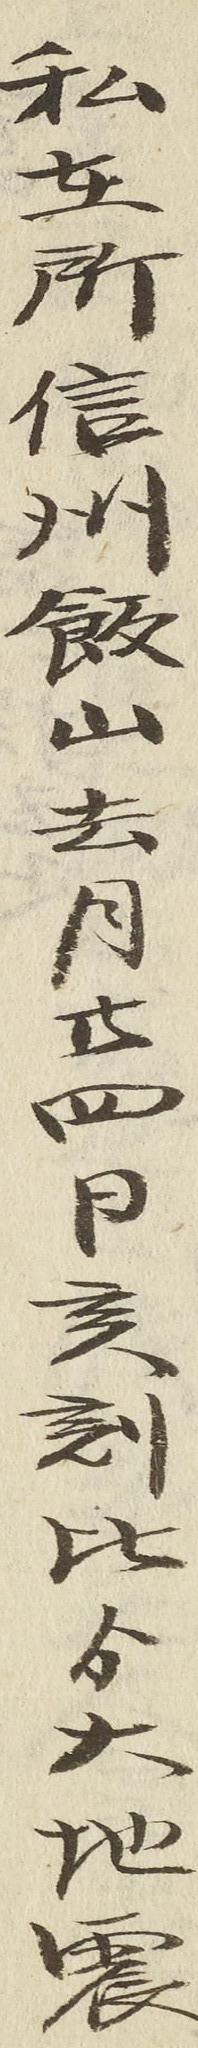私在所信州飯山去月廿四日亥刻比ゟ大地震
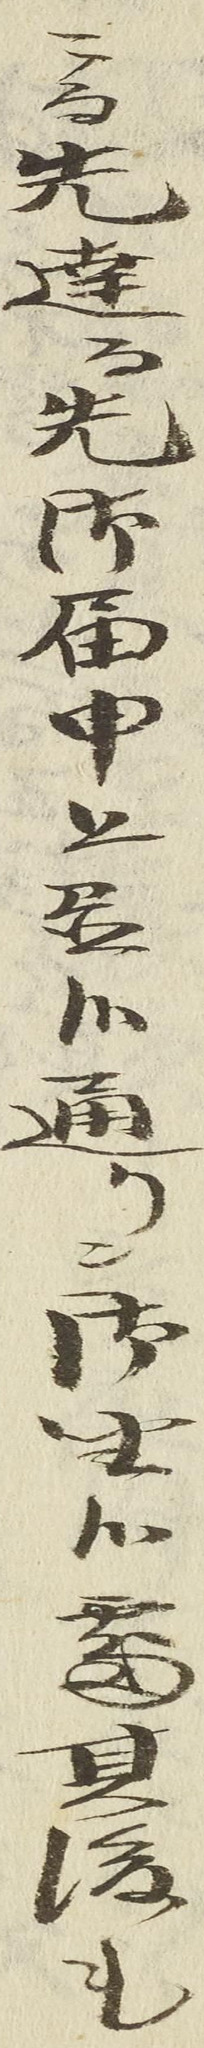二而先達而先御届申上置候通り二御坐候処其後も
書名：信濃國大地震記　乾
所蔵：東京大学地震研究所図書室 Earthquake Research Institute Library, The University of Tokyo, JAPAN
